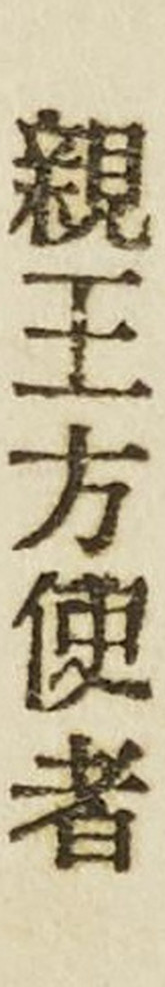親王方使者
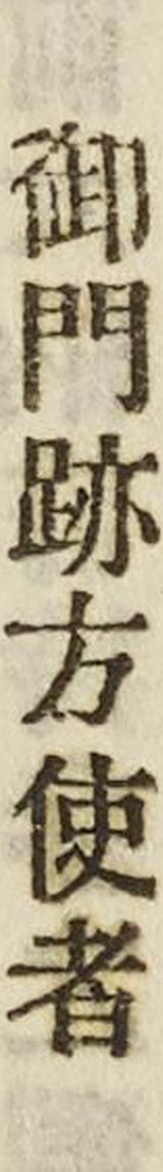御門跡方使者
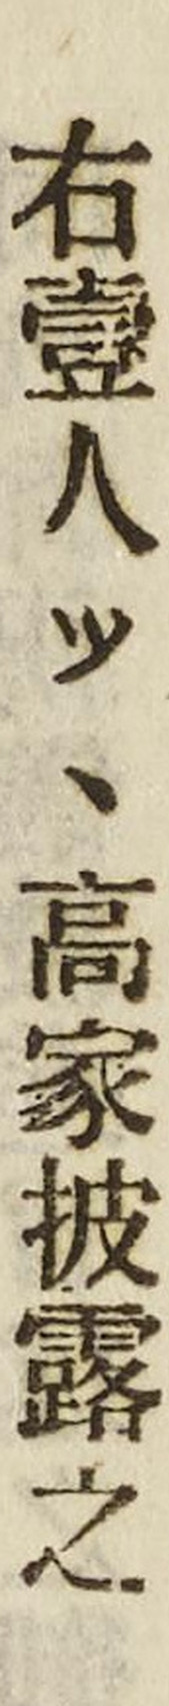右壱人ツヽ高家披露之
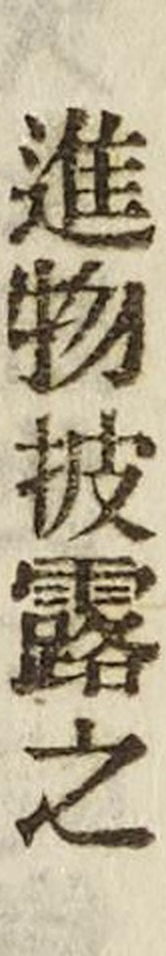進物披露之
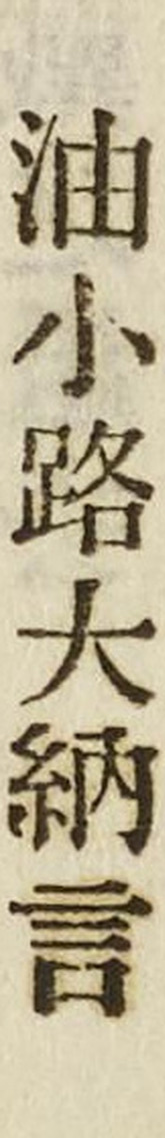油小路大納言
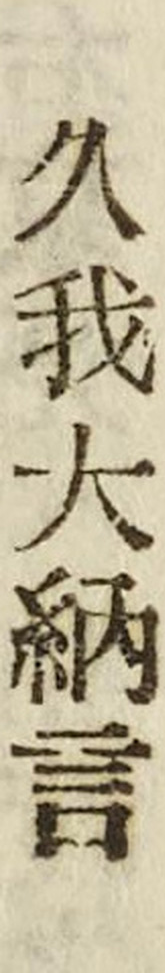久我大納言
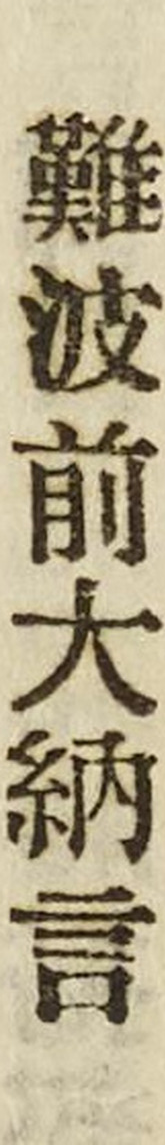難波前大納言
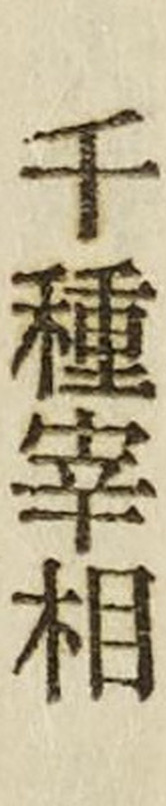千種宰相
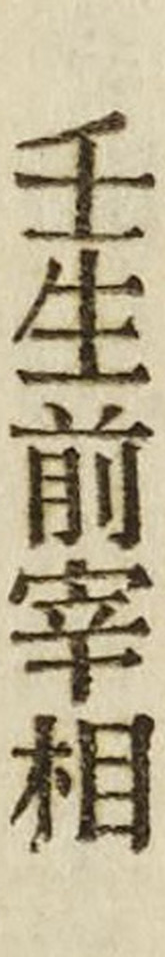壬生前宰相
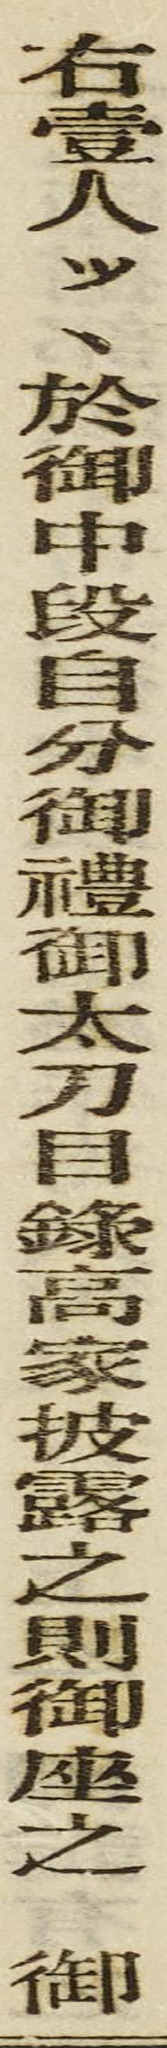右壱人ツヽ於御中段自分御礼御太刀目録高家披露之則御座之御
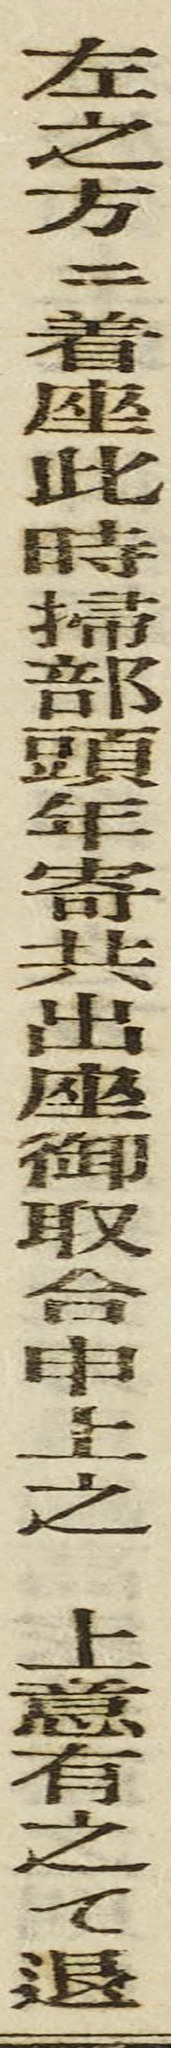左之方ニ着座此時掃部頭年寄共出座御取合申上之上意有之て退
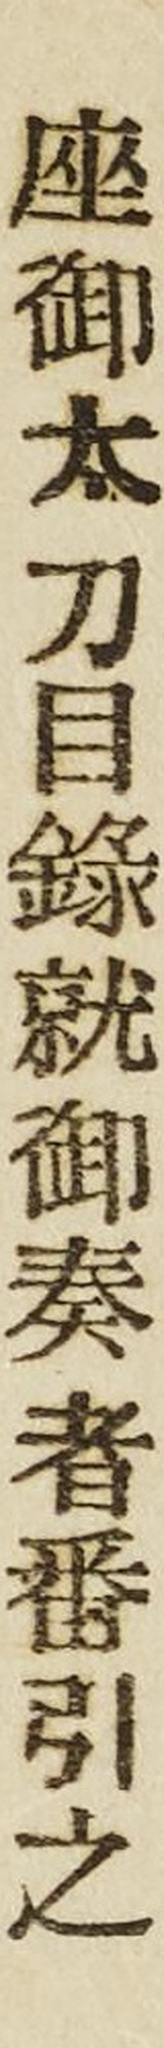座御太刀目録就御奏者番引之
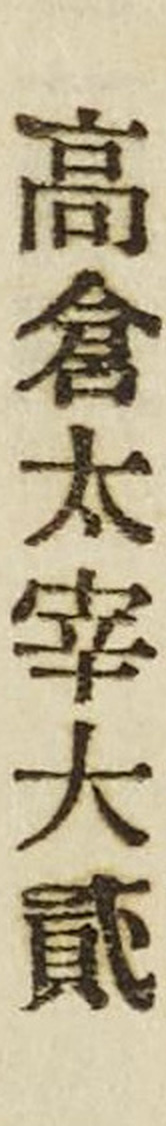高倉太宰大貳
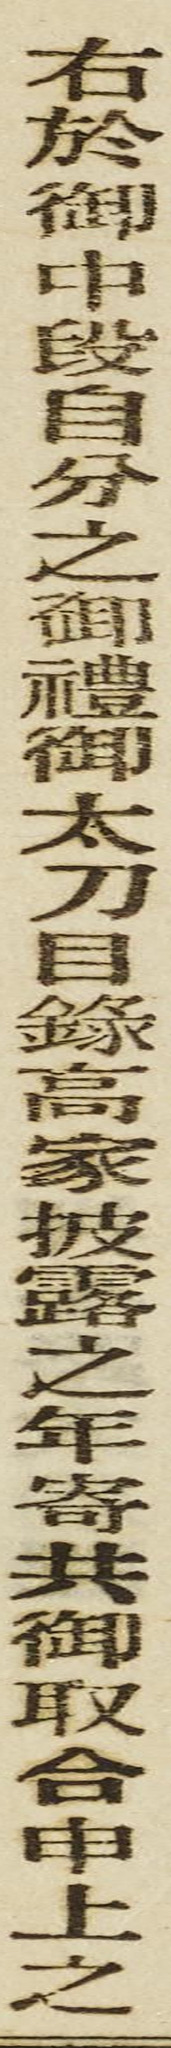右於御中段自分之御礼御太刀目録高家披露之年寄共御取合申上之
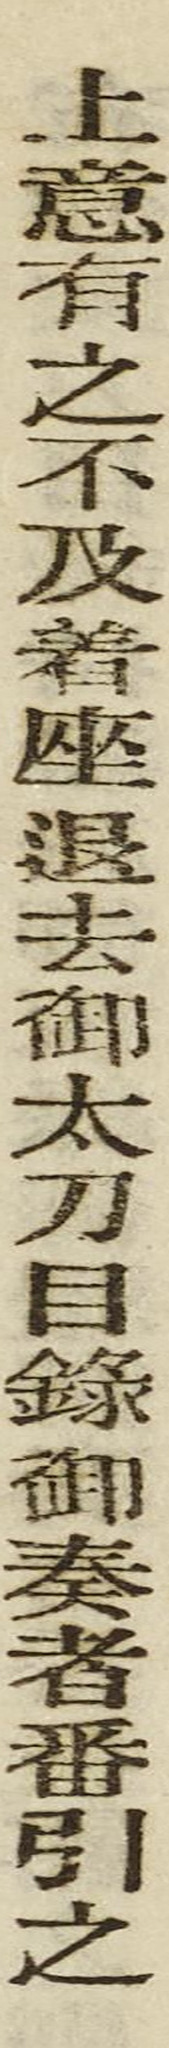上意有之不及着座退去御太刀目録御奏者番引之
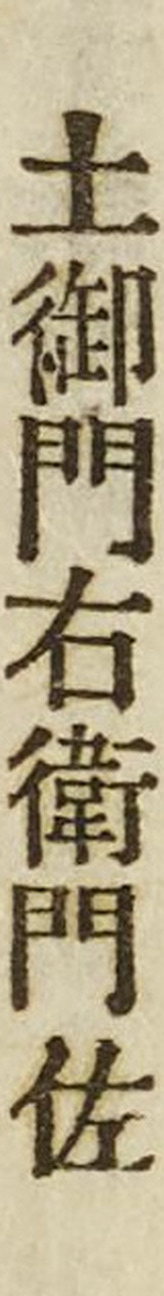土御門右衛門佐
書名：史籍集覽　朝鮮陣古文・細井廣澤記・颶風紀事・天明七年將軍宣下次第書　全
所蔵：東京大学地震研究所図書室 Earthquake Research Institute Library, The University of Tokyo, JAPAN
